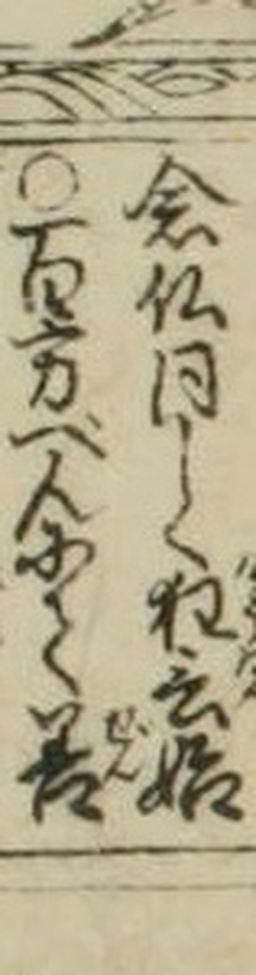○百万べんにて善
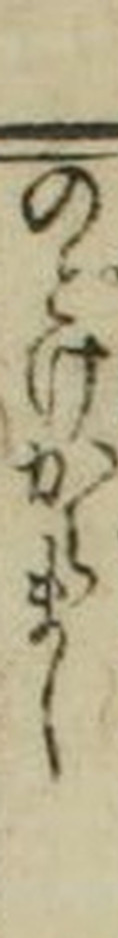のどけからまし
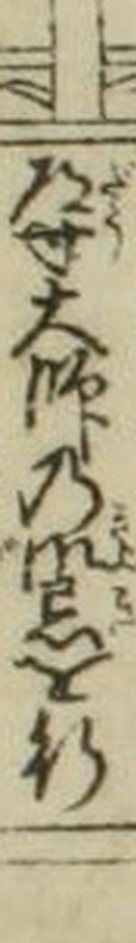導大師の御忌を行
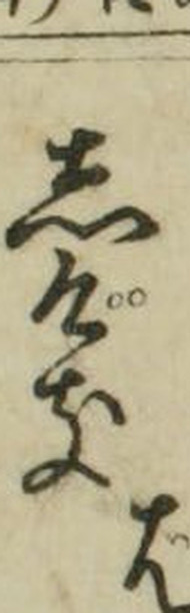しげき
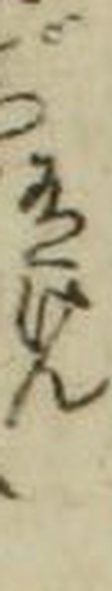有けん
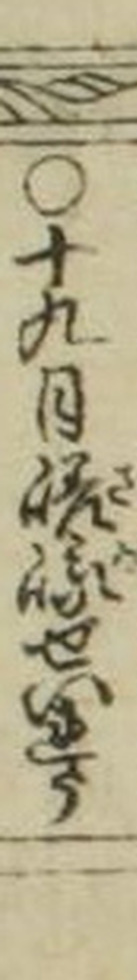○十九日嵯峨せいれう
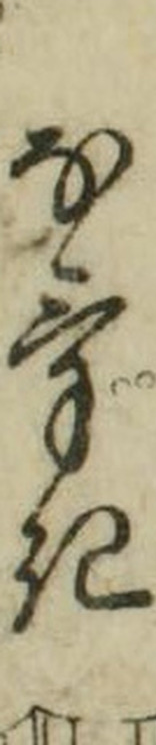なげき
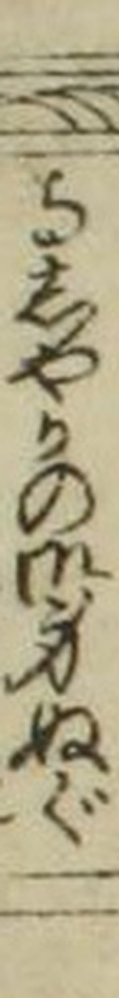寺しやかの御身ぬぐ
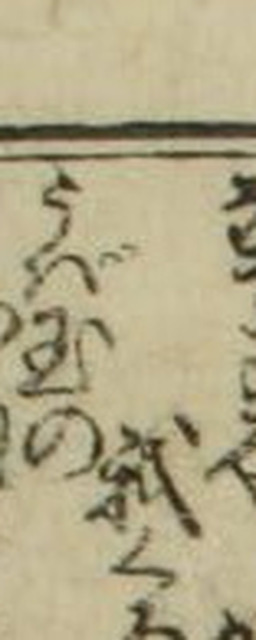うば玉の
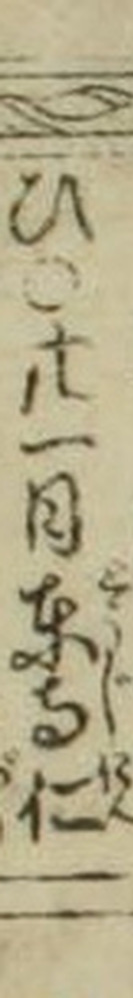ひ○廿一日東寺仁
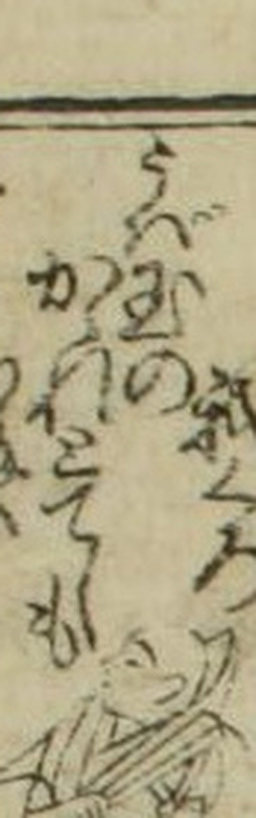かゝれとてしも
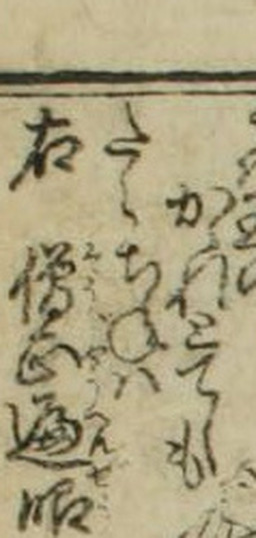たらちねは
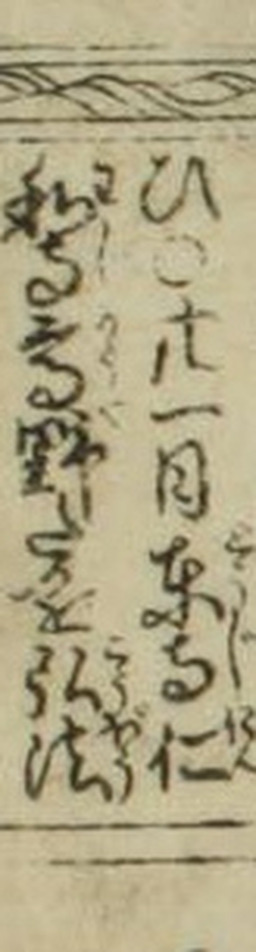和寺高野たかを弘法
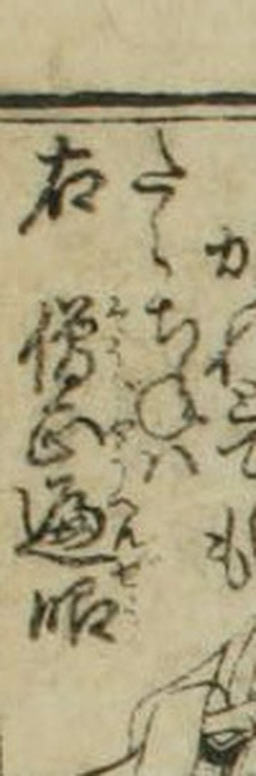右僧正遍照
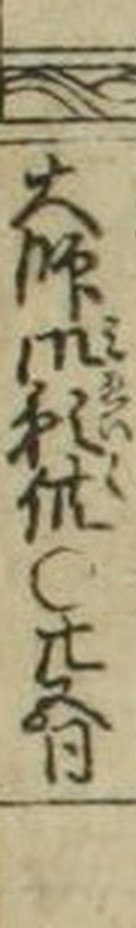大師御影供○廿五日
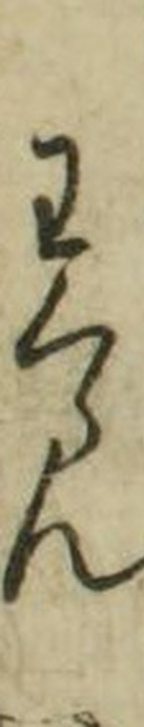わくらん
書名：女源氏教訓鑑
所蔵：東京学芸大学附属図書館
